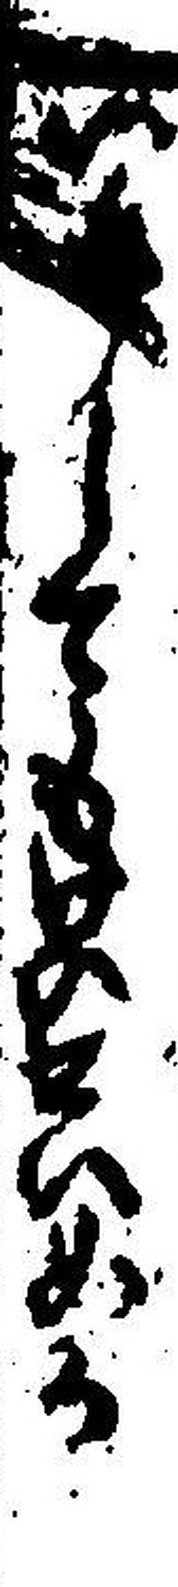いかにしてもけいせいめか
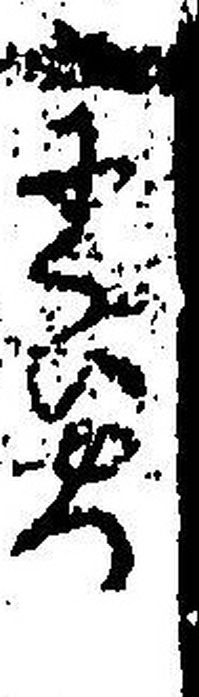にくいやつ
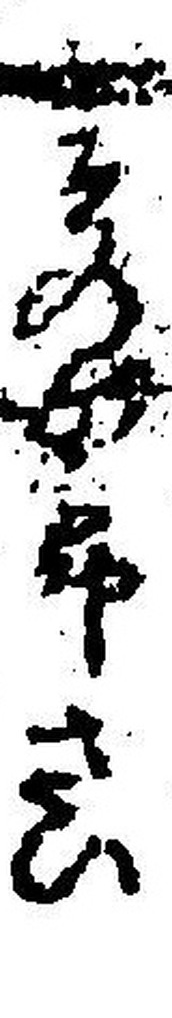その女郎さい
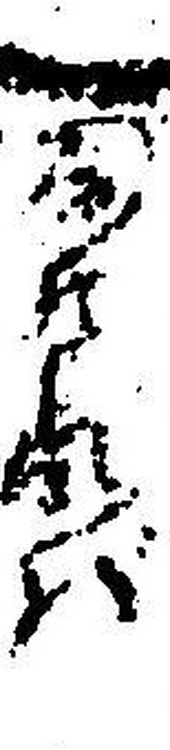なければ
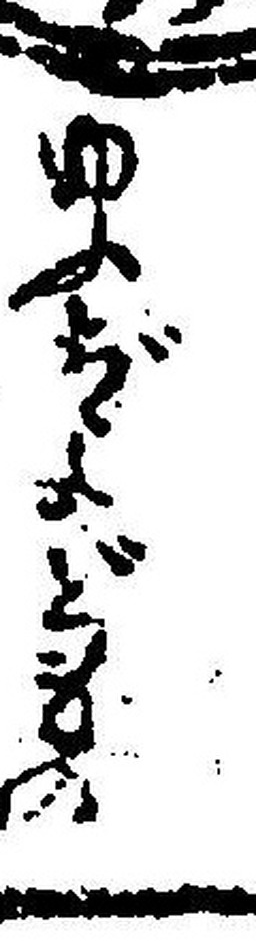ゆふぢよどもの
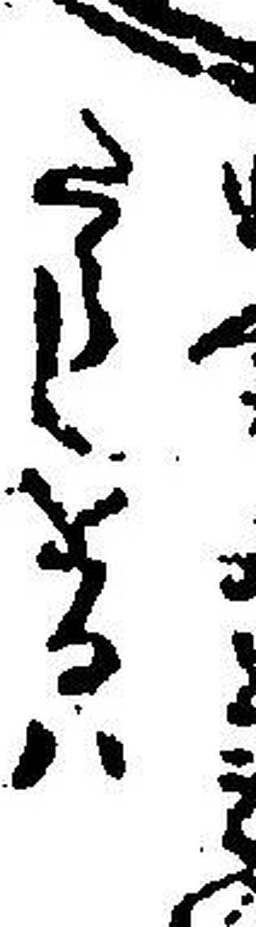たらしをるは
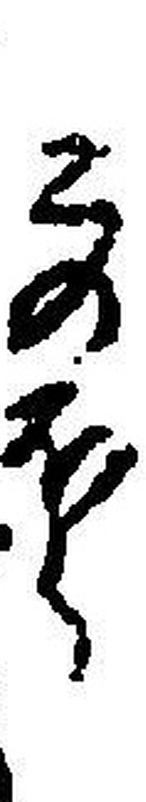このほう
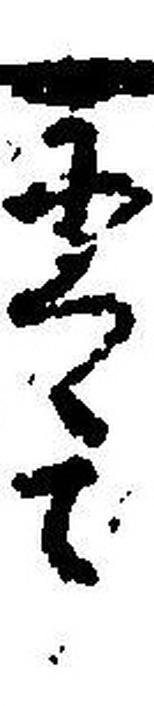にくゝて
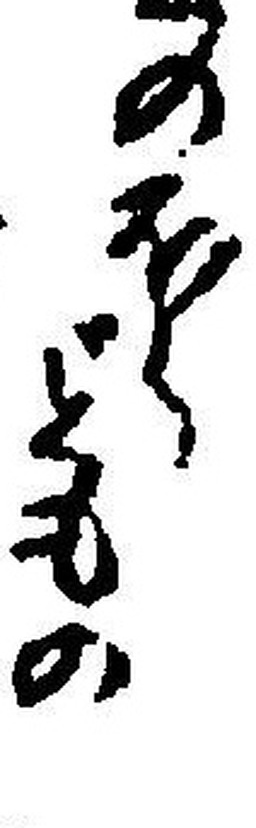どもの
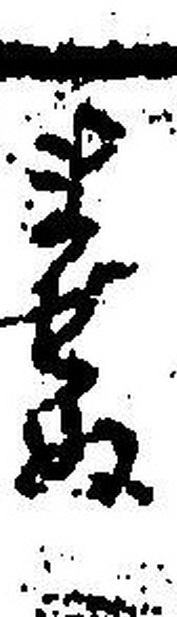ませぬ
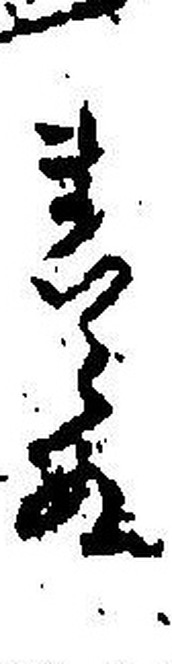まいらぬ
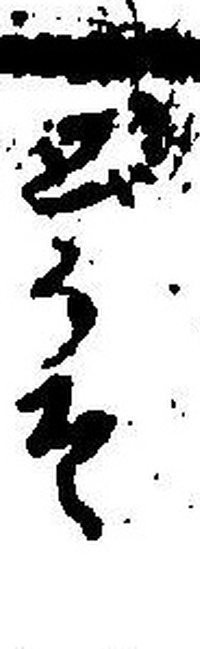とうそ
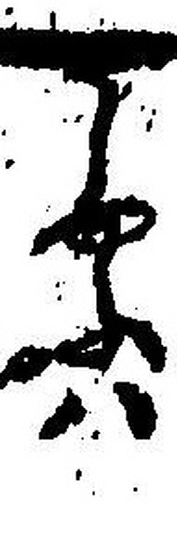しやふは
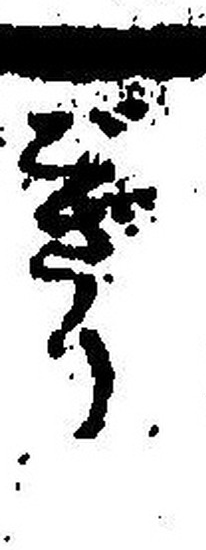ござり
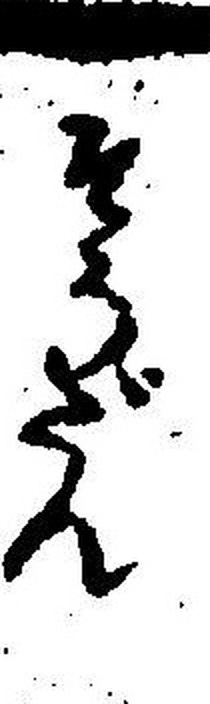そうだん

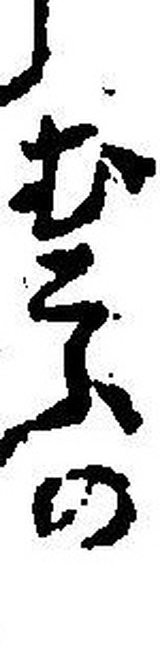むこふの
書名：御代参牛時詣 / 市場通笑作
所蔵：東京大学総合図書館 General Library in the University of Tokyo, JAPAN
